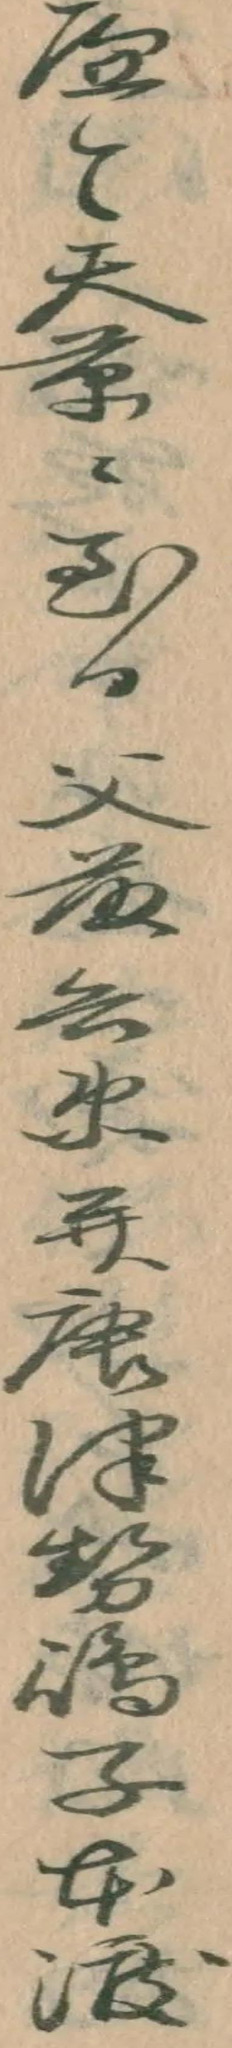扁て天草に至る父藤兵衛幷唐津勢島子本渡
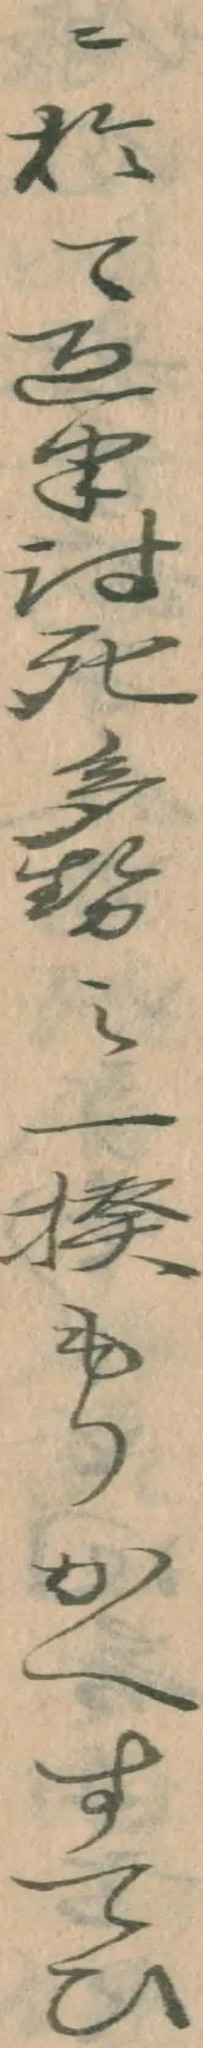に於て過半討死多勢之一揆もりかへすてひ
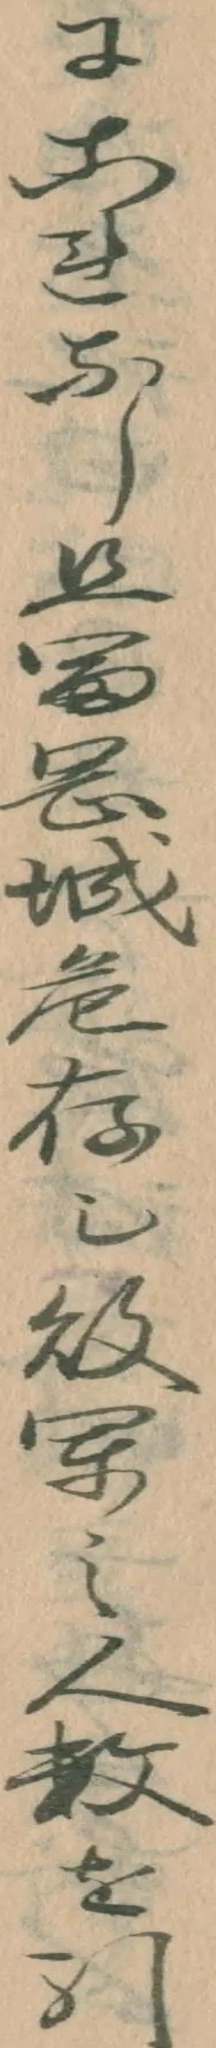尓古連なし且冨岡城危存し敗軍之人数を引
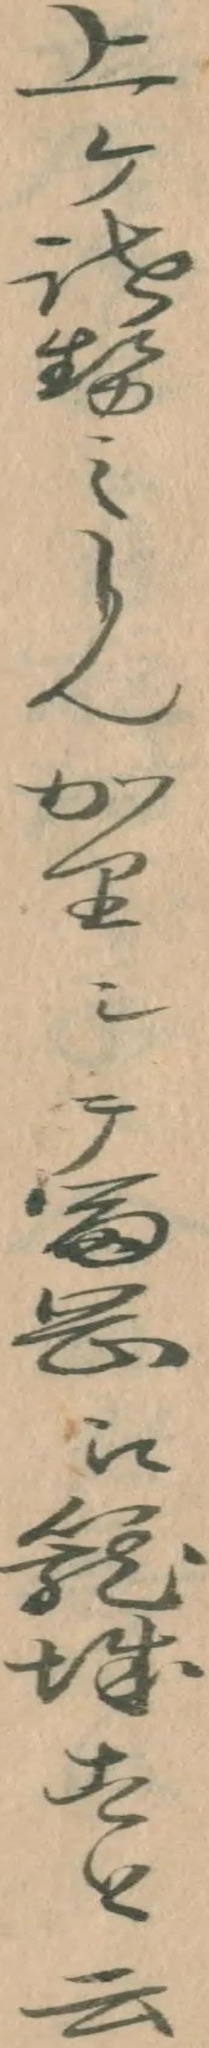上け諸勢之しん加里して冨岡江籠城春と云

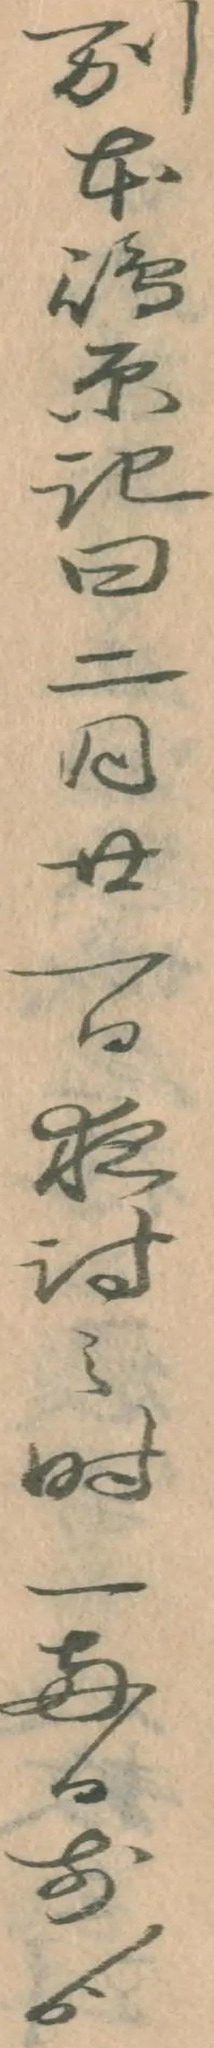別本島原記曰二月廿一日夜討之時一両日前ゟ
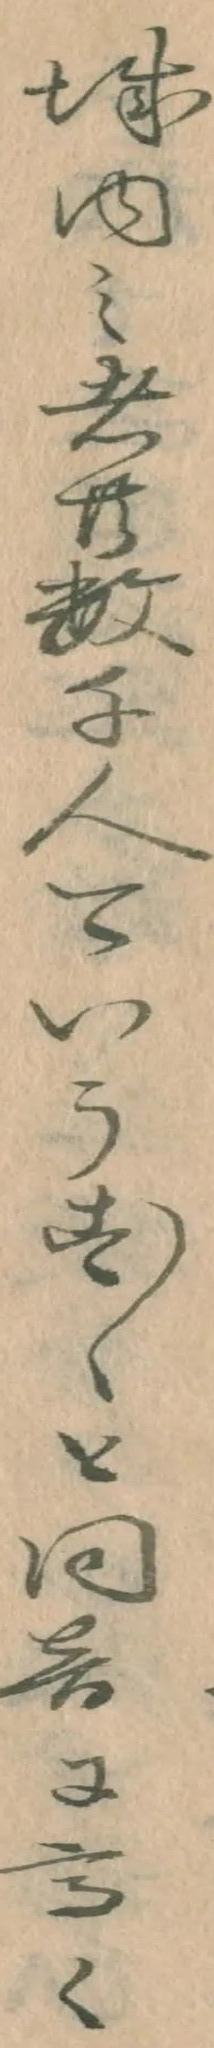城内之者共数千人ていう春々と同音尓高く
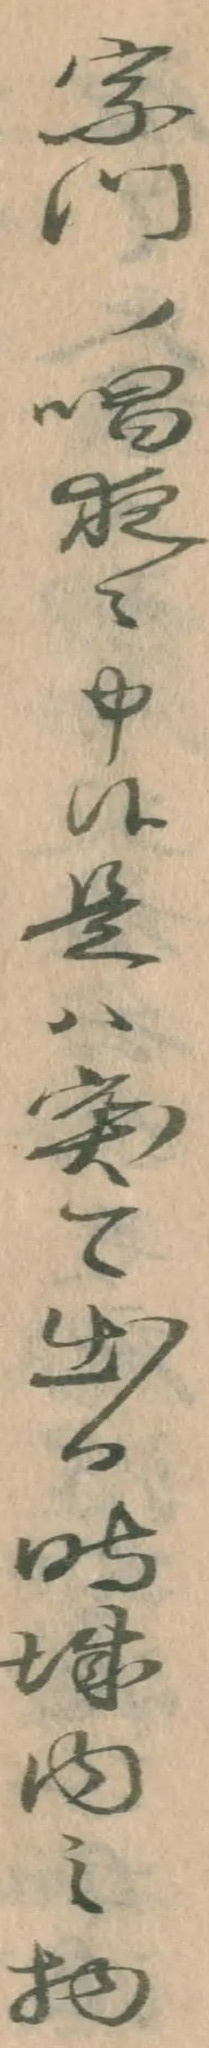宗門の唱夜に申候是は突て出る時城内之物
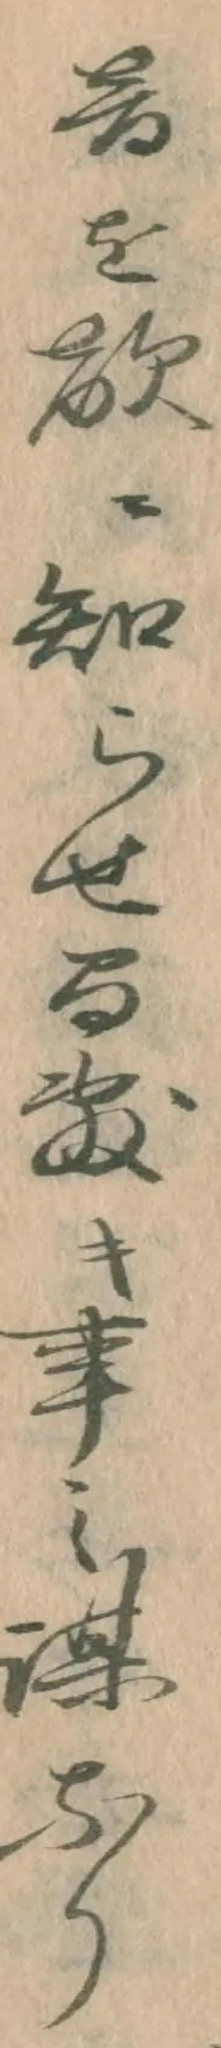音を敵に知らせ間敷き事之謀なり
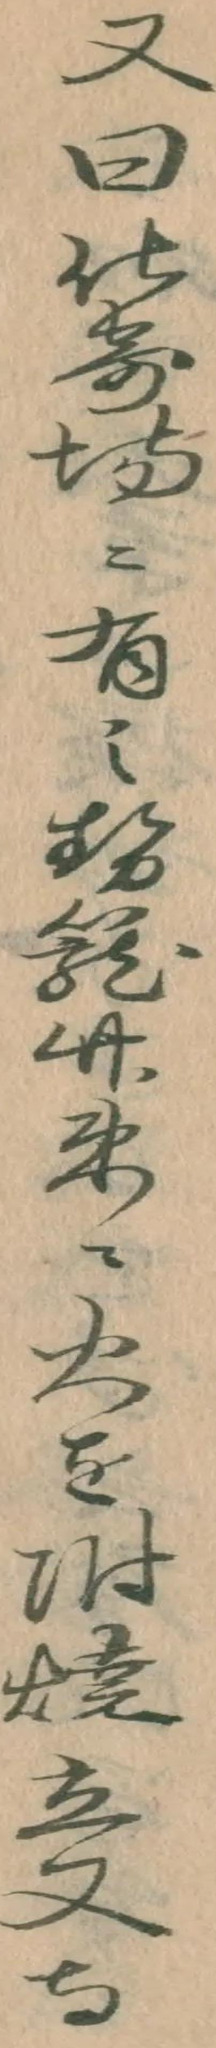又曰仕寄場に有之勢籠竹束に火を附焼立又寺
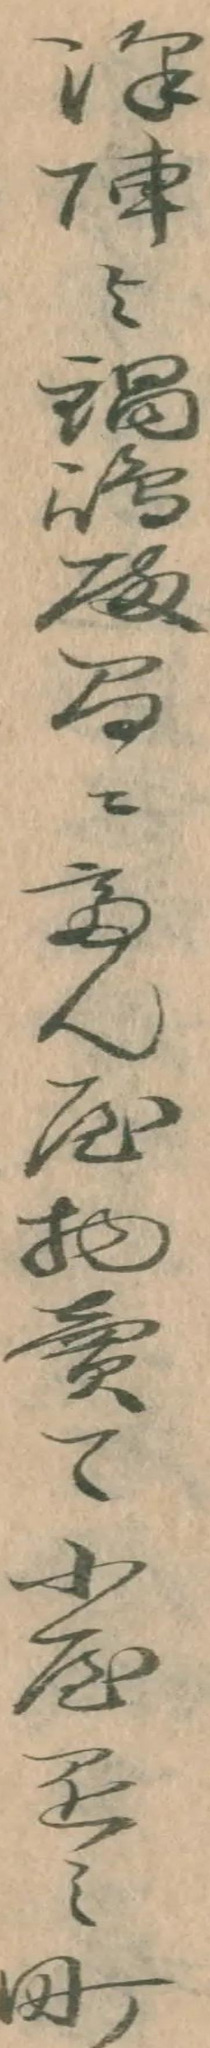沢陣与鍋島殿間に高ん屋物売て小屋懸之町
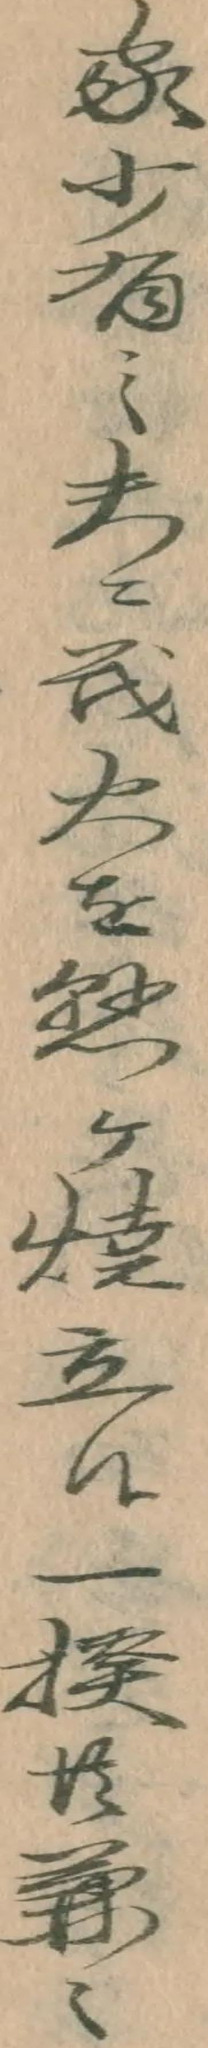家少有之夫に茂火を懸け焼立候一揆共兼々
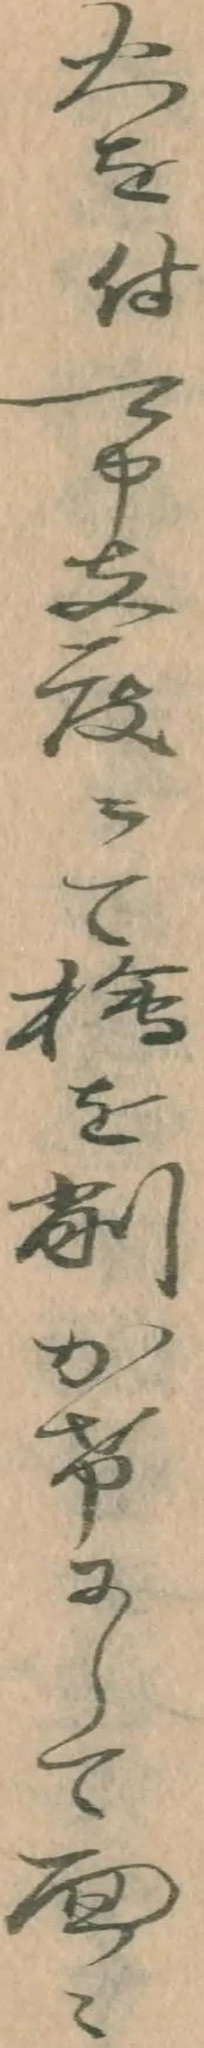火を付可申仕度にて鎗を削か希尓して面々
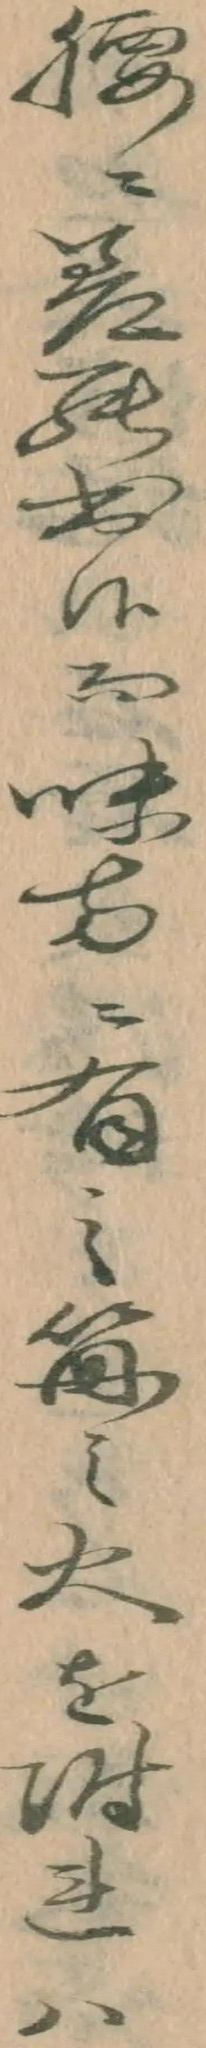腰に差罷出候而味方に有之篝之火を附連は
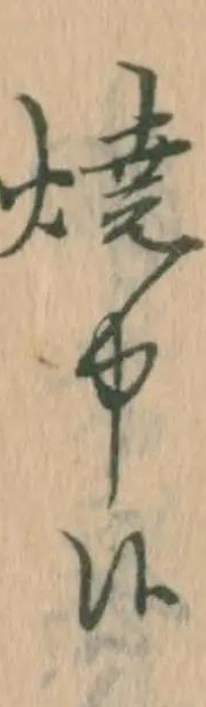焼申候
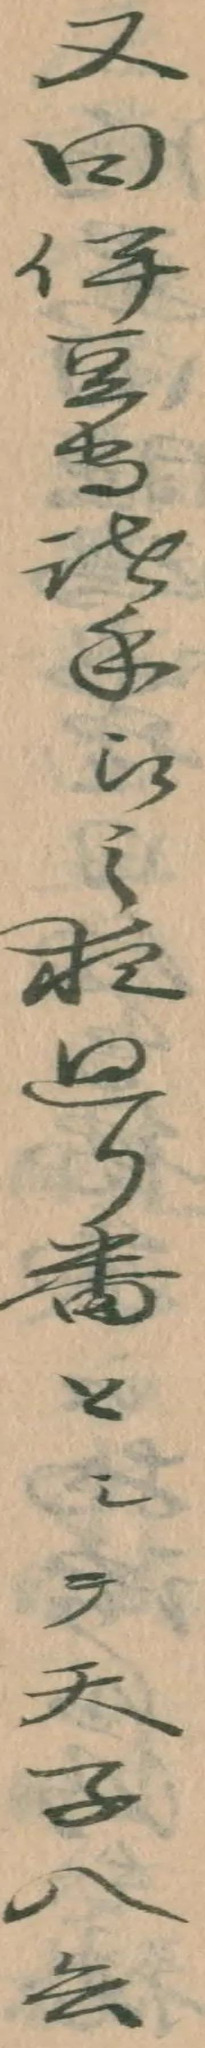又曰伊豆守諸手江之夜廻り番として天子八兵
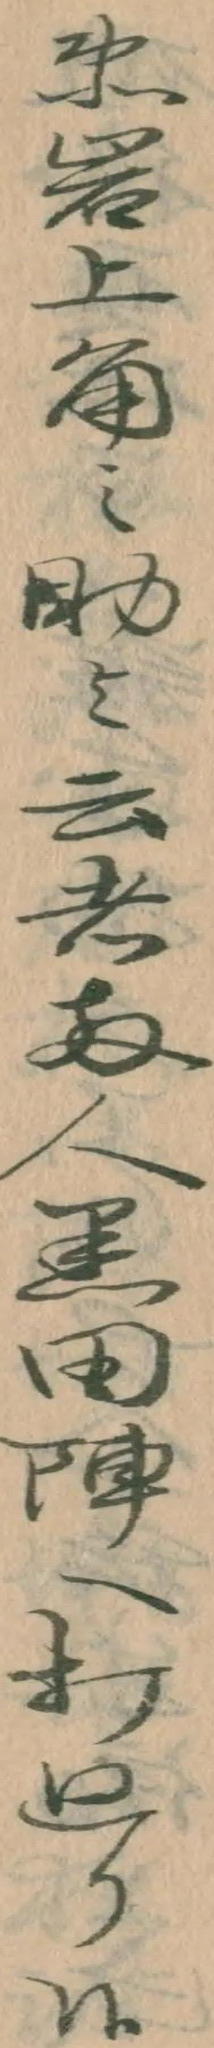衛岩上角之助与云者両人黒田陣へ打廻り候
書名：切支丹御退治記 49巻. [7]
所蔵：国立国会図書館 National Diet Library, JAPAN
